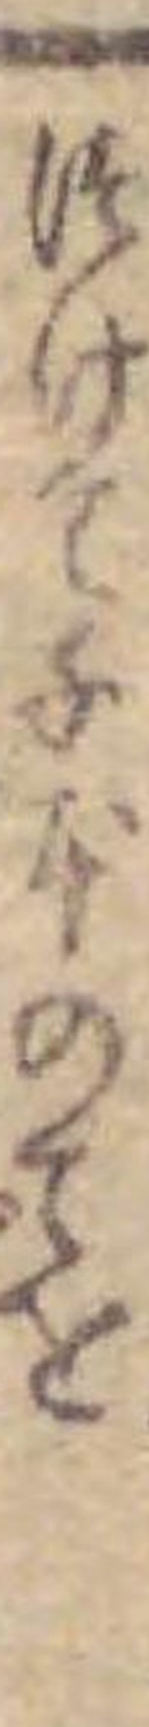つけて千本のてを
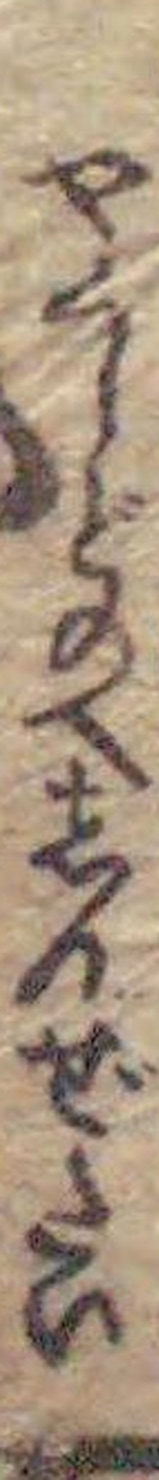やくしどのへしんぜたい
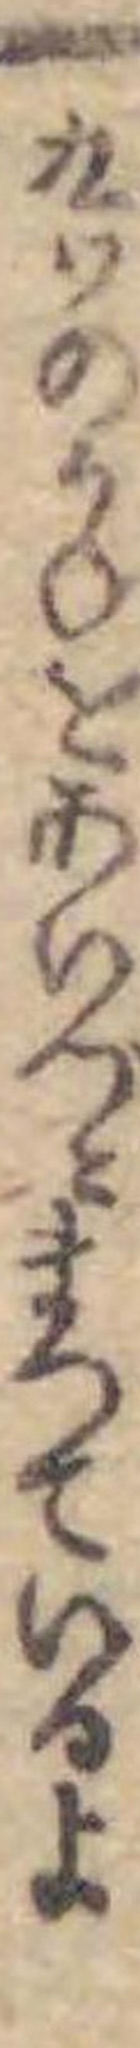九つのかねをあいづにまつているよ
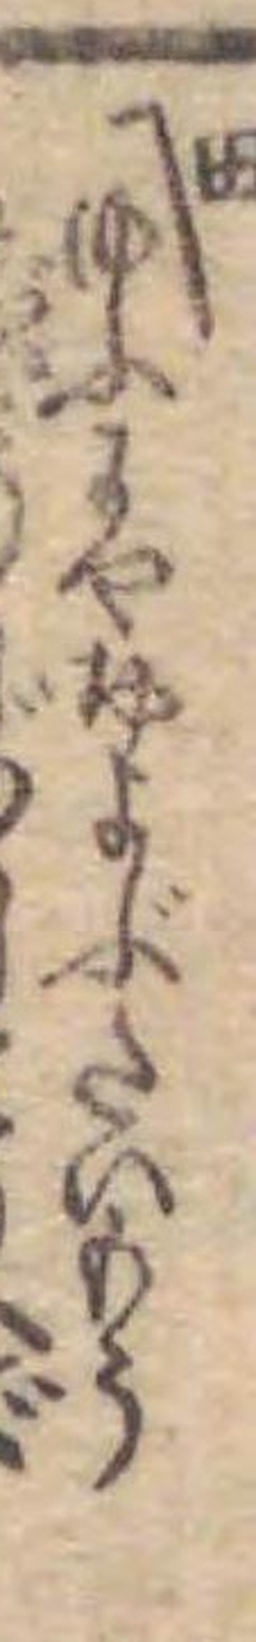田〽ゆふにやおよぶたいもう
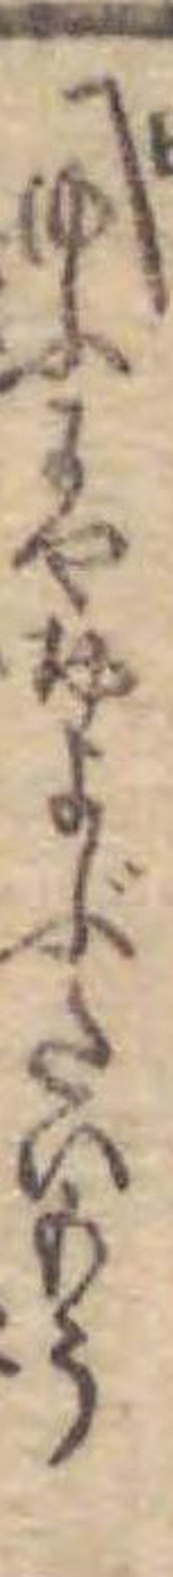田〽ゆふにやおよぶたいもう
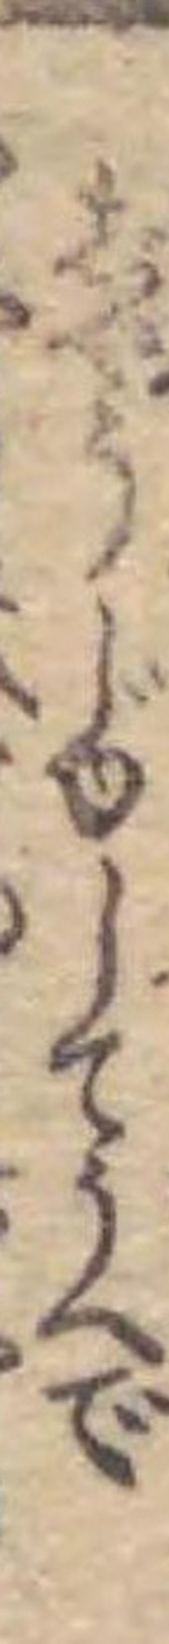じやうじゆしてうへで
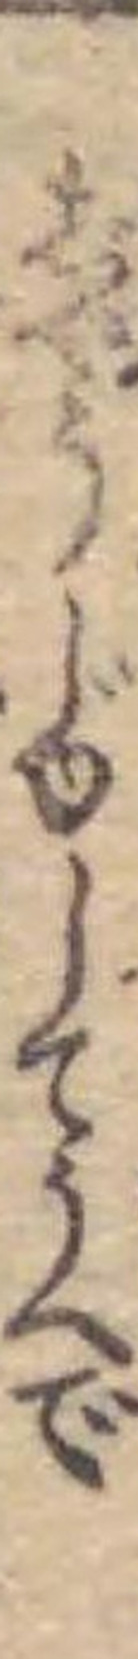じやうじゆしてうへで
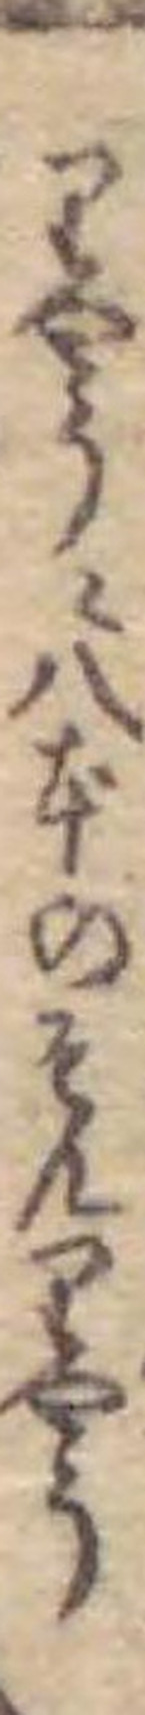りやうに八本のそんりやう
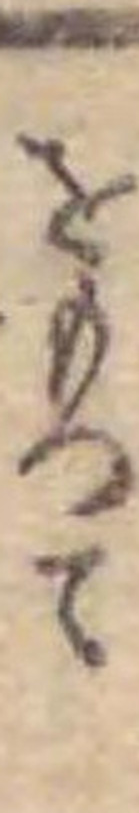をもつて
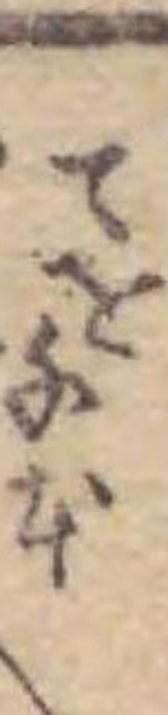てを千本
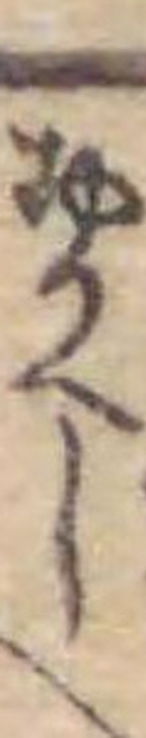おかへし
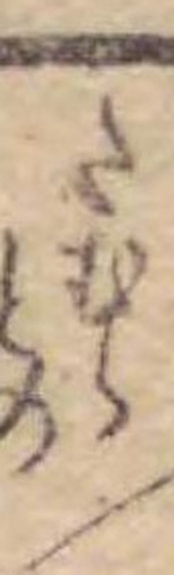たむら
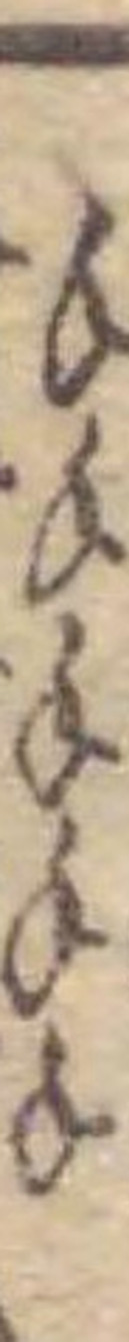手手手手手
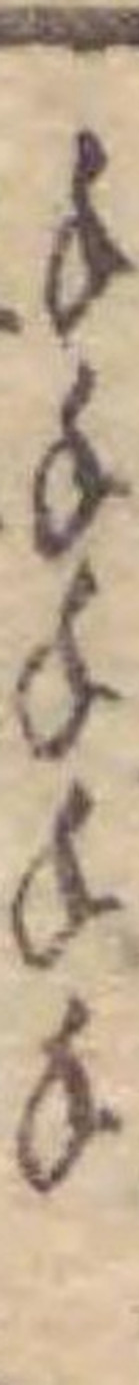手手手手手
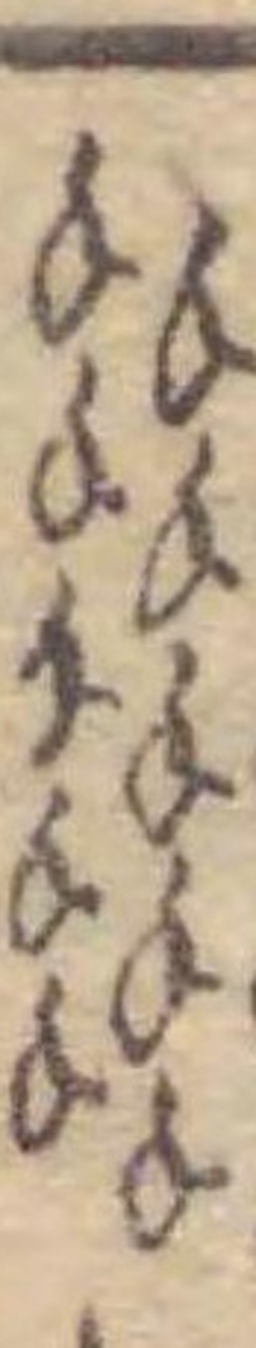手手手手手
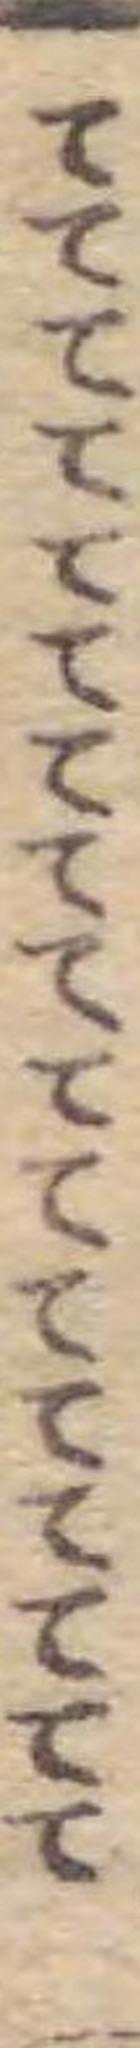ててててててててててててててててて
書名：大悲の千六本 : 1巻
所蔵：国立国会図書館 National Diet Library, JAPAN
